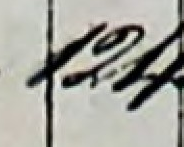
124
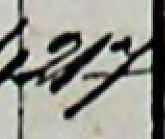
217
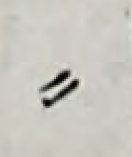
„
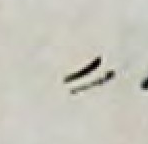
„
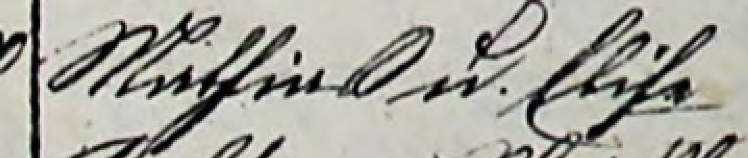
Mathias u. Elise
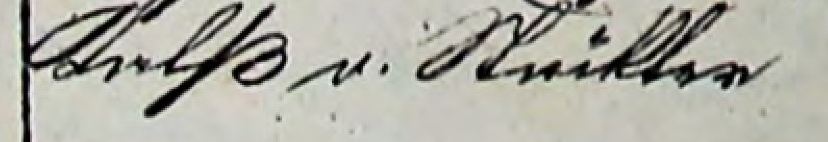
Kalß v. Stückler
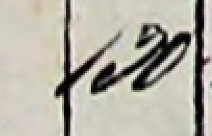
130
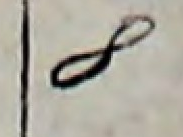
8
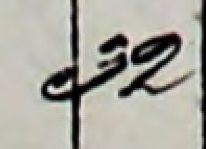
32
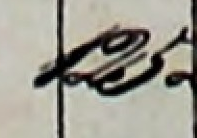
125
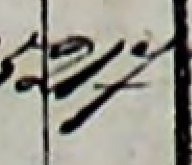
217
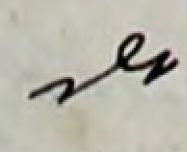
do
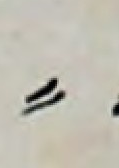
„
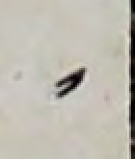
„
